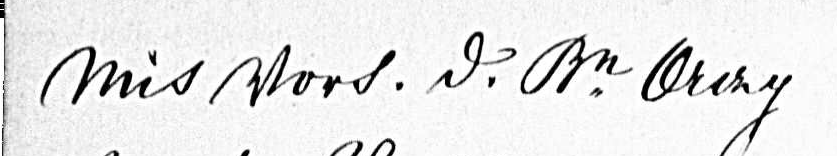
Mis Vort. d. Bn. Orvey
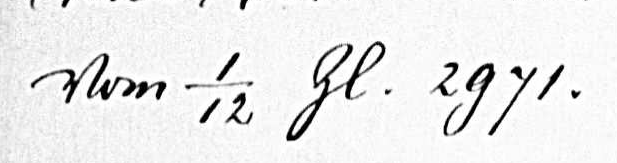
vom 1/12 Zl. 2971.
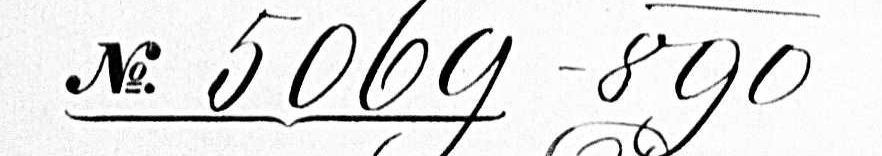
No. 5069 - 890
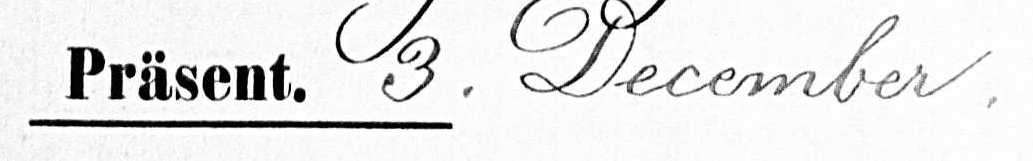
Präsent. 3. December.
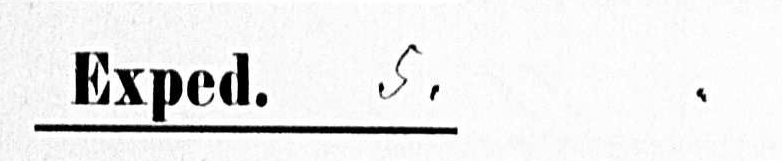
Exped. 5. December.
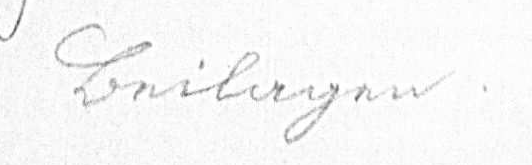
Beilagen.
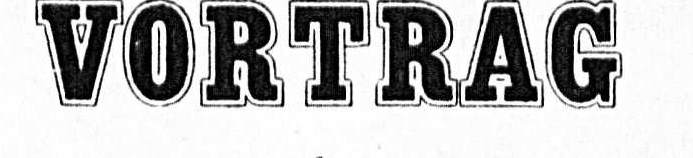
Vortrag
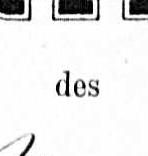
des
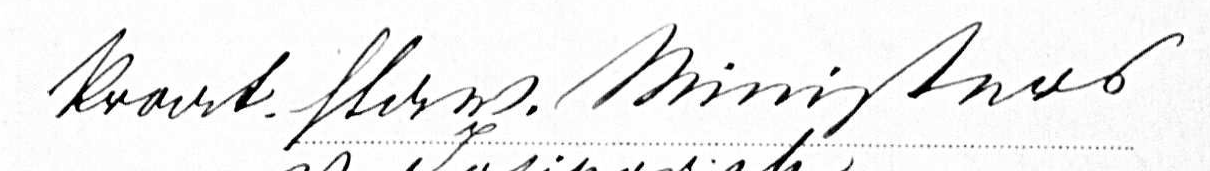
kroat. slav. Ministers
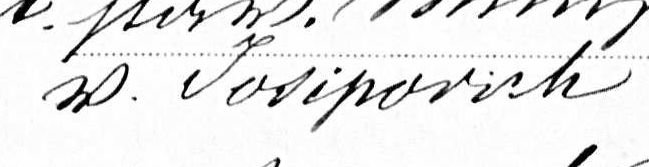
v. Josipovich
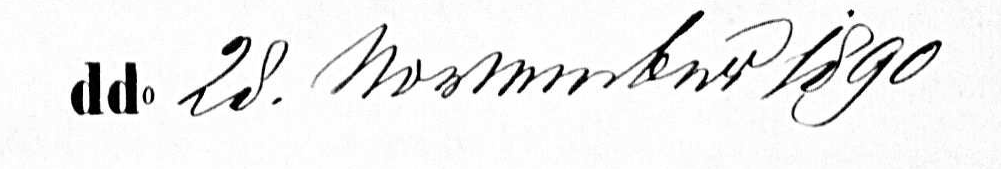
ddo 28. November 1890
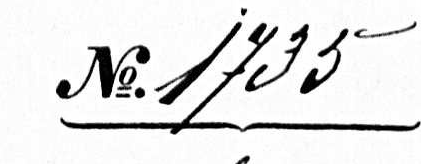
No. 1735
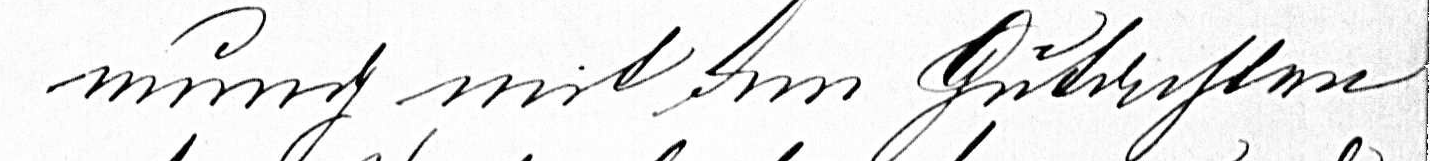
mung mit den Gutachten
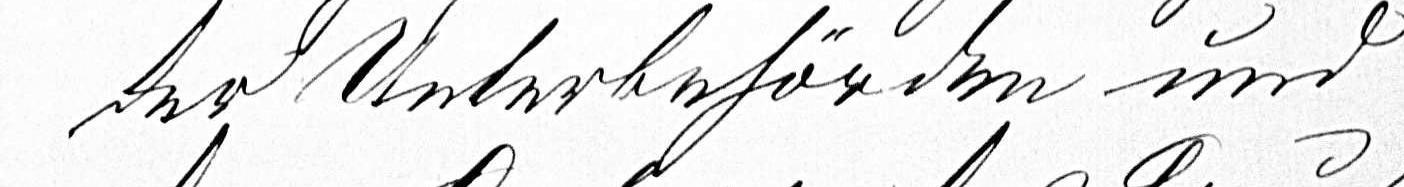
der Unterbehörden und
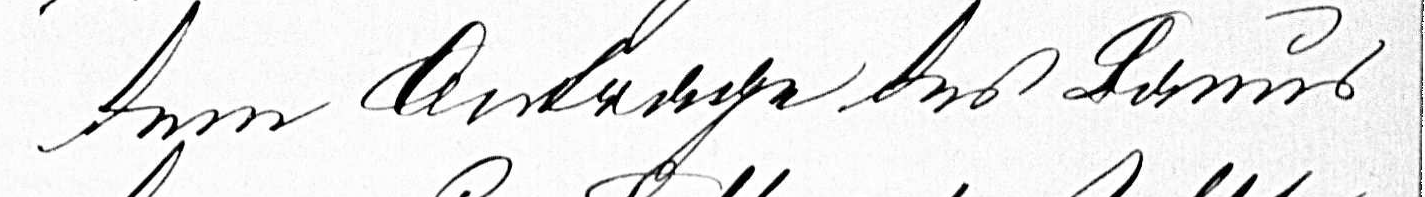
dem Antrage des Banus
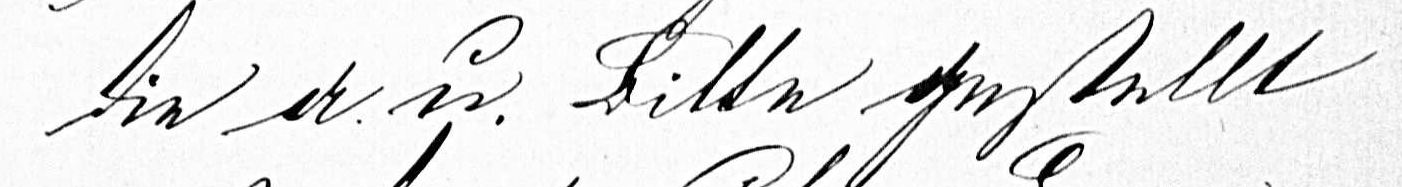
die a. u. Bitte gestellt
